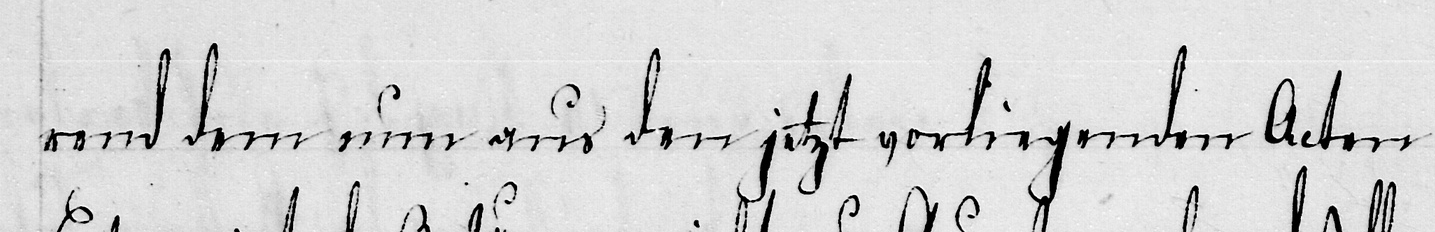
rend dem nun aus den jetzt vorliegenden Acten
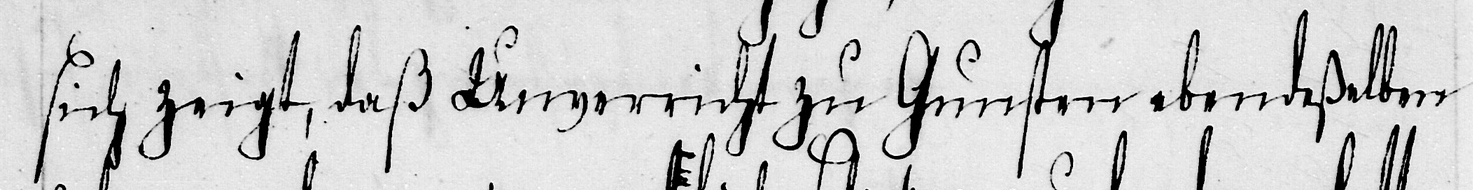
sich zeigt, daß Unverricht zu Gunsten ebendeßelben
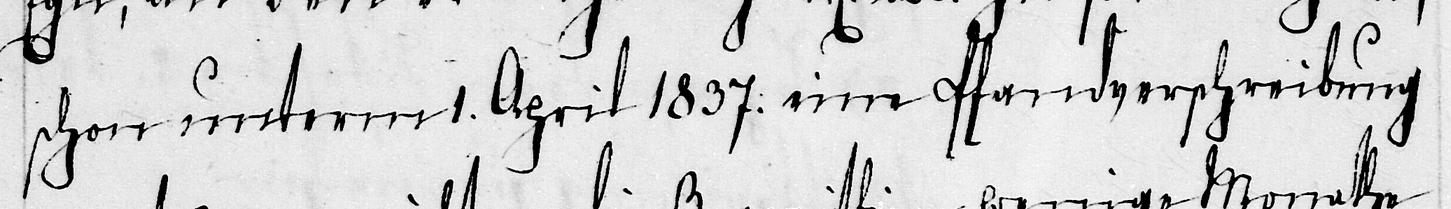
schon unterm 1. April 1837. eine Pfandverschreibung
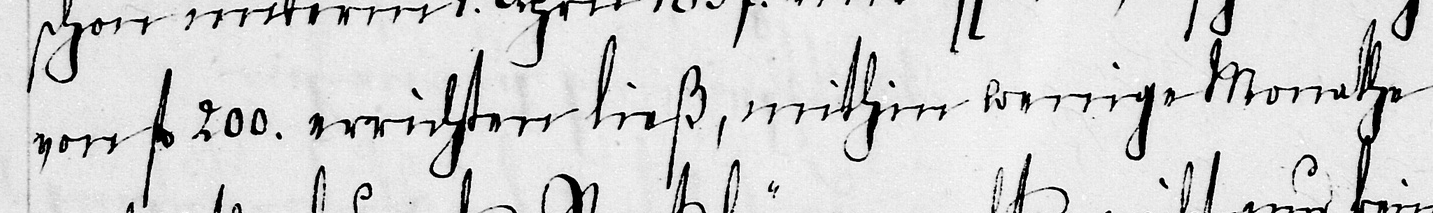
von fl. 200. errichten ließ, mithin wenige Monathe
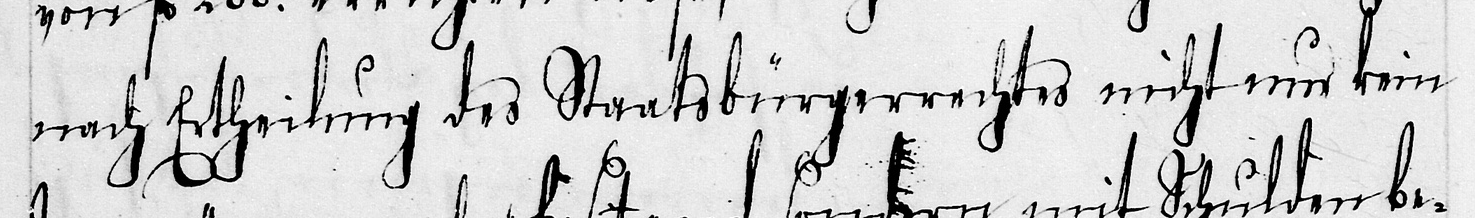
nach Ertheilung des Staatsbürgerrechtes nicht nur kein
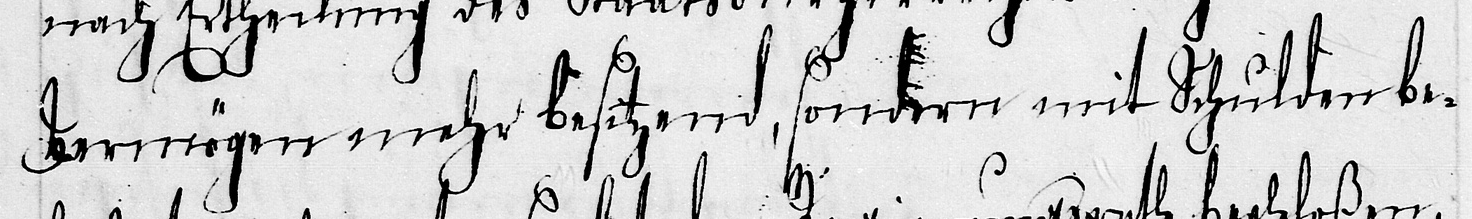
Vermögen mehr besitzend, sondern mit Schulden be¬
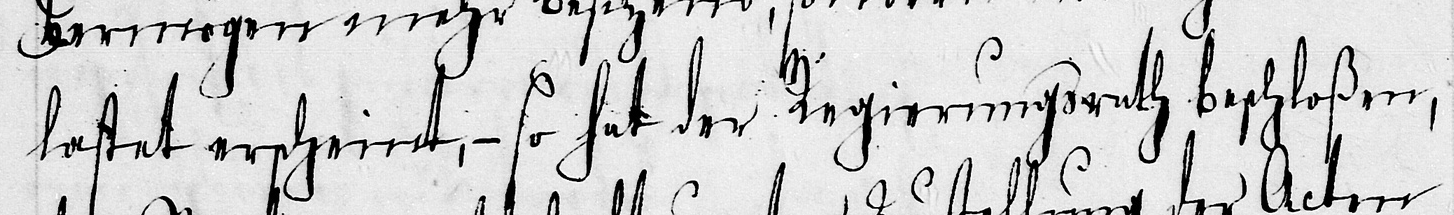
lastet erscheint, – so hat der Regierungsrath beschloßen,
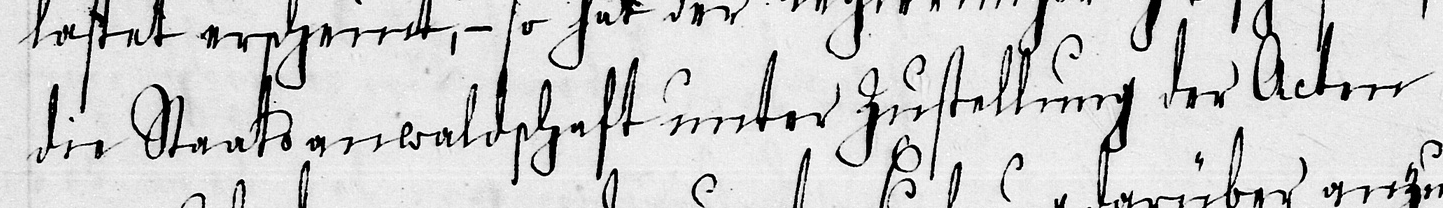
die Staatsanwaldschaft unter Zustellung der Acten
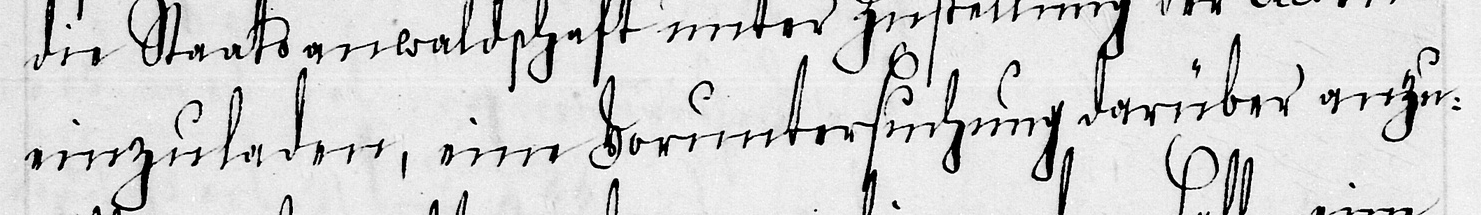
einzuladen, eine Voruntersuchung darüber anzu¬
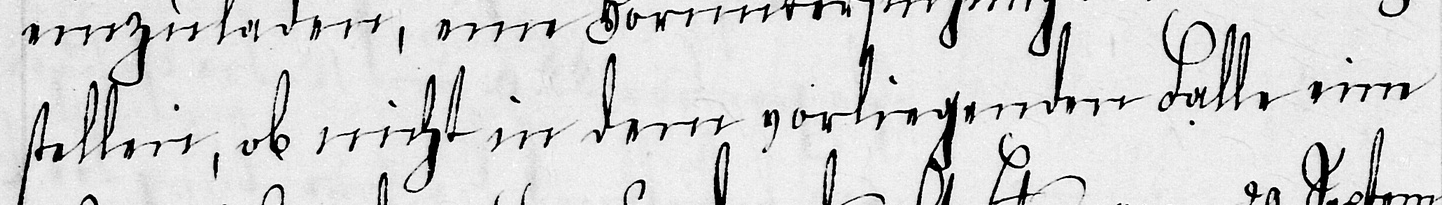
stellen, ob nicht in dem vorliegenden Falle eine
